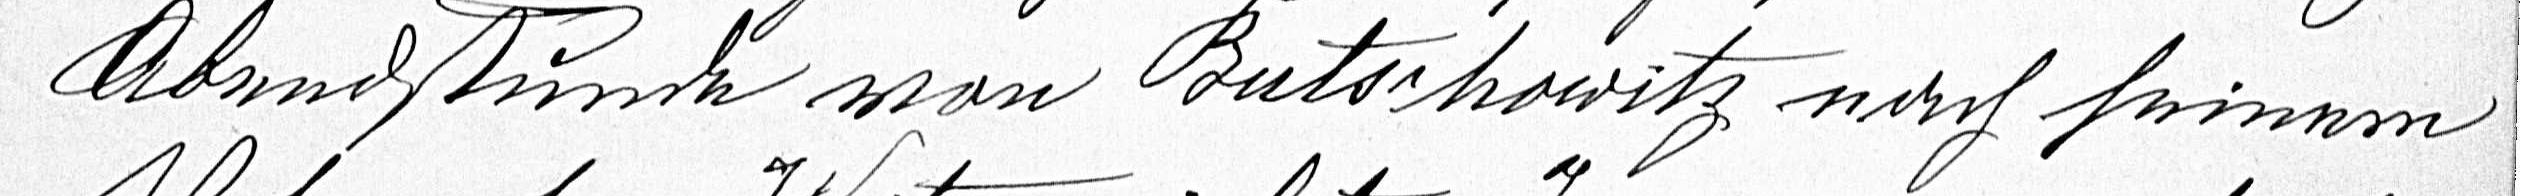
Abendstunde von Butschowitz nach seinem
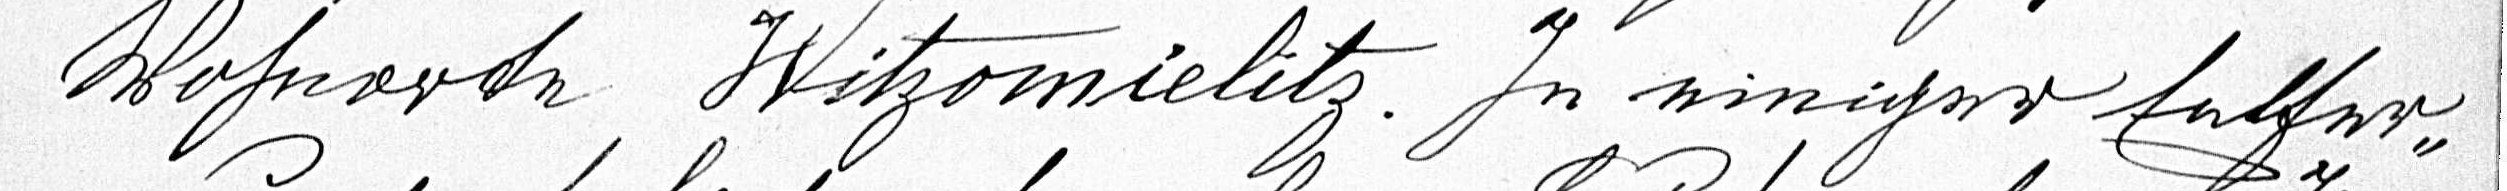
Wohnorte Witzomielitz. In einiger Entfer¬
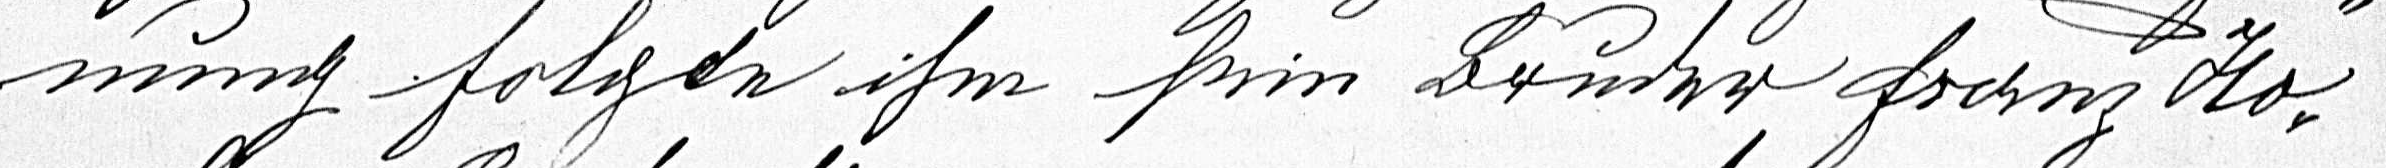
nung folgte ihm sein Bruder Franz Ho¬
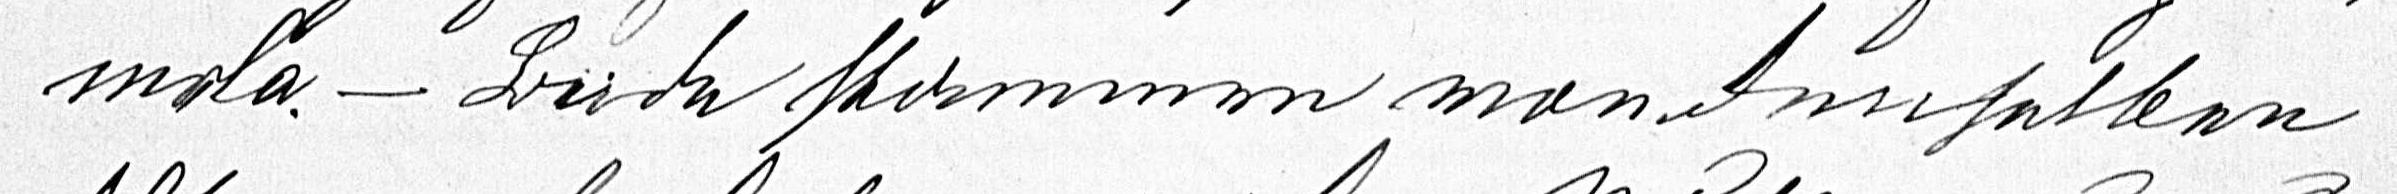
mola. Beide stammen von denselben
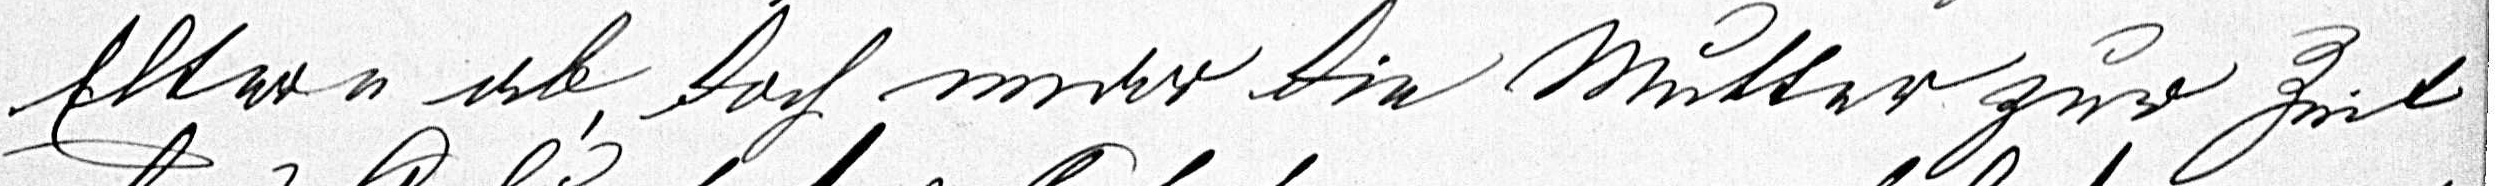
Eltern ab, doch war die Mutter zur Zeit
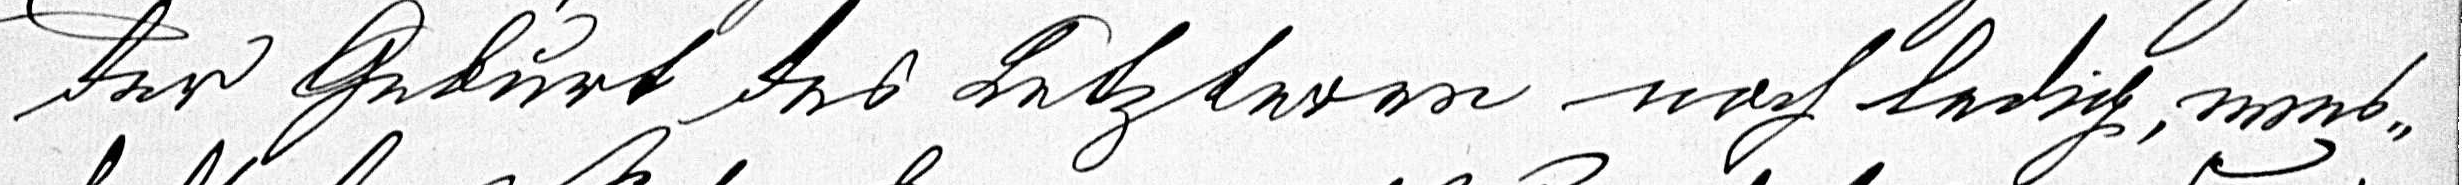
der Geburt des Letzteren noch ledig, wes¬
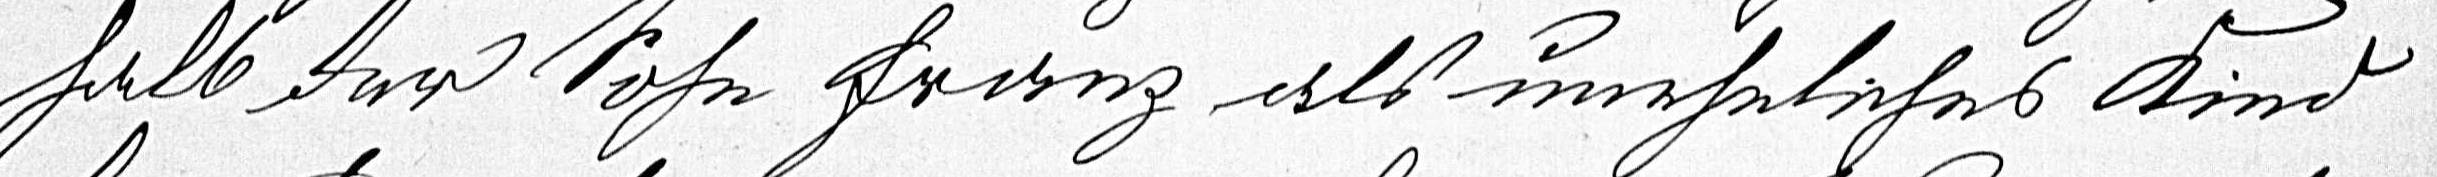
halb der Sohn Franz als uneheliches Kind
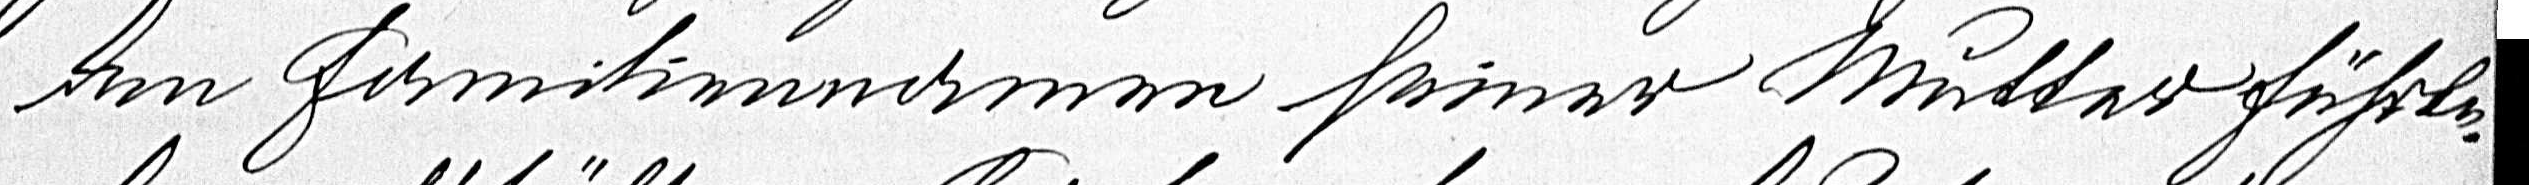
den Familiennamen seiner Mutter führte.
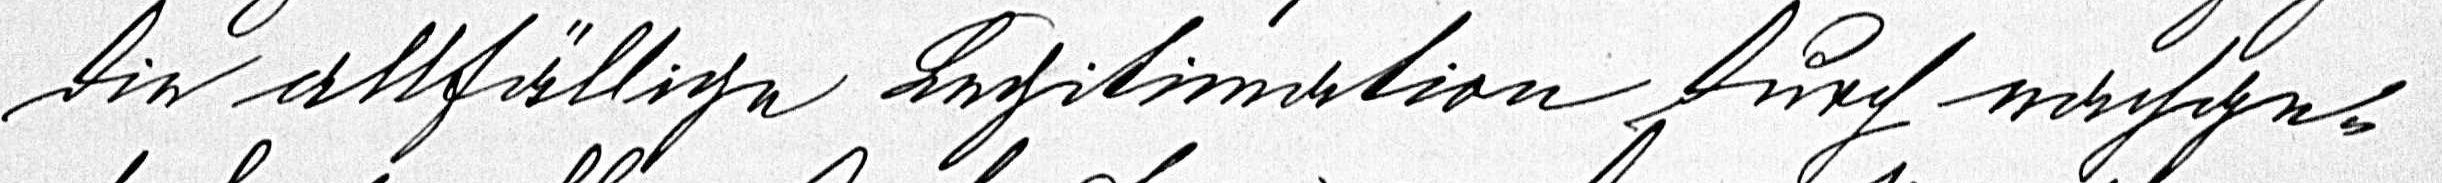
Die allfällige Legitimation durch nachge¬
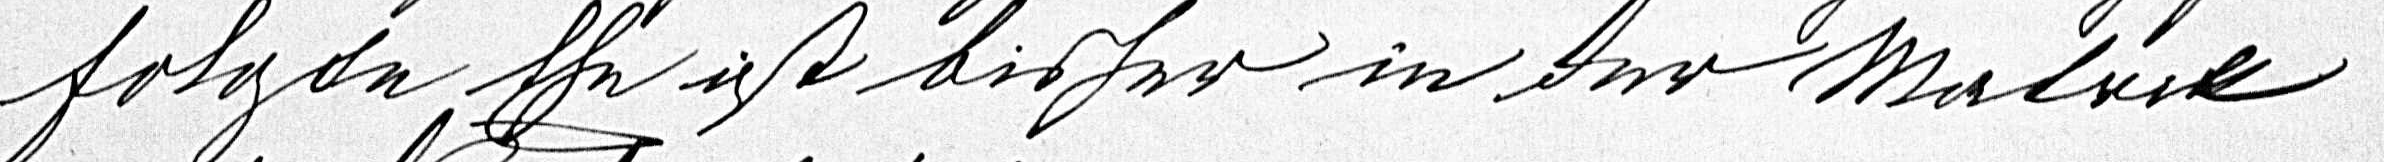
folgte Ehe ist bisher in der Matrik
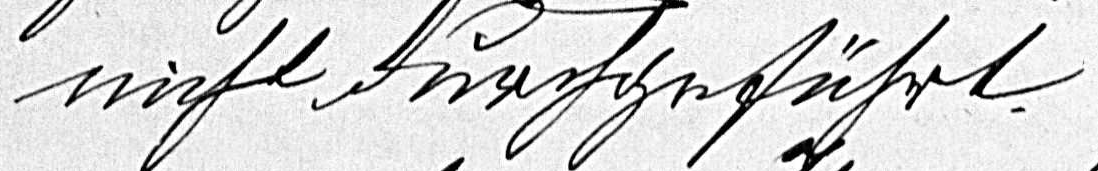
nicht durchgeführt.
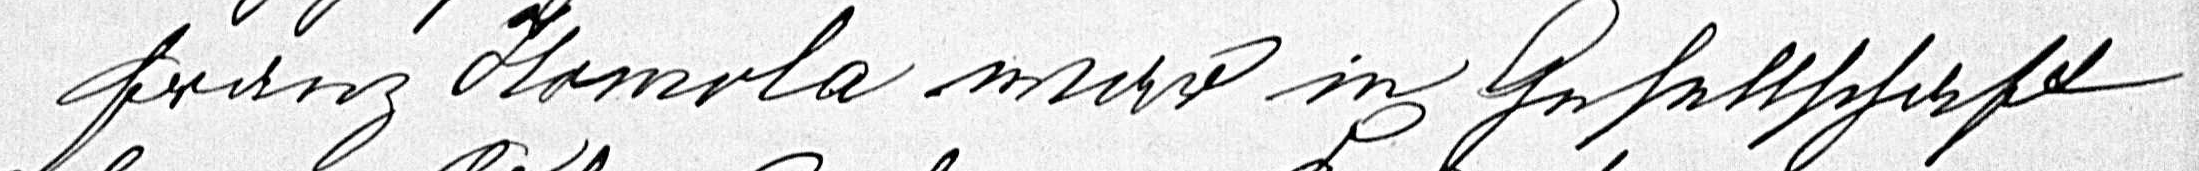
Franz Homola war in Gesellschaft
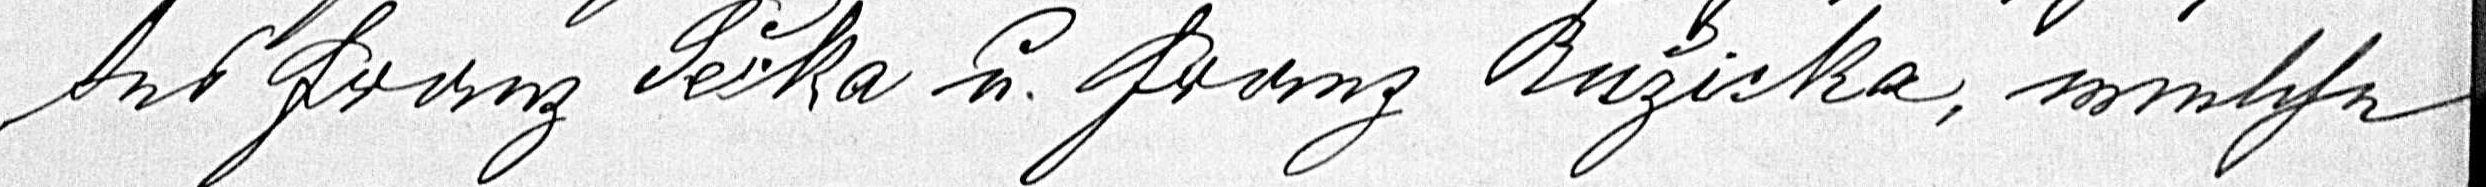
des Franz Sečka u. Franz Bužička, welche
